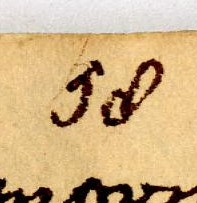58
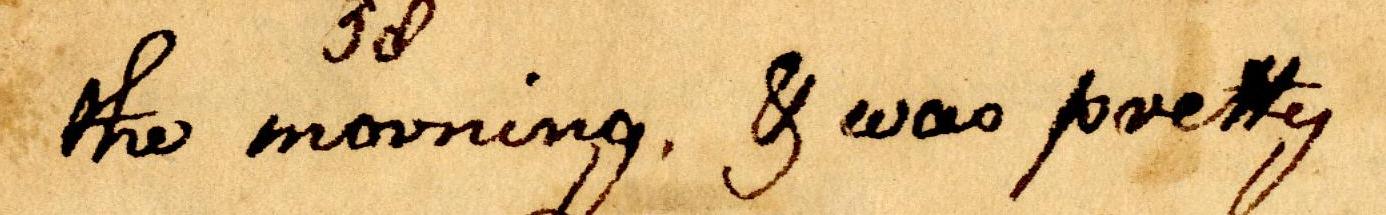the morning, & was pretty
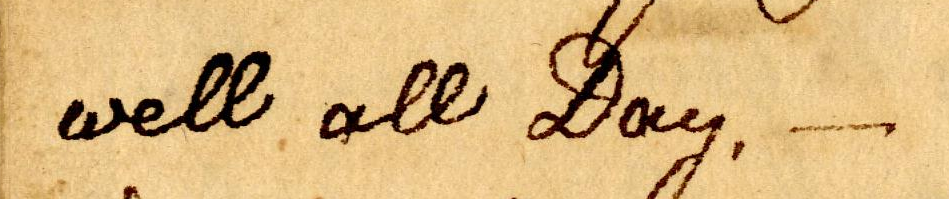well all Day,-
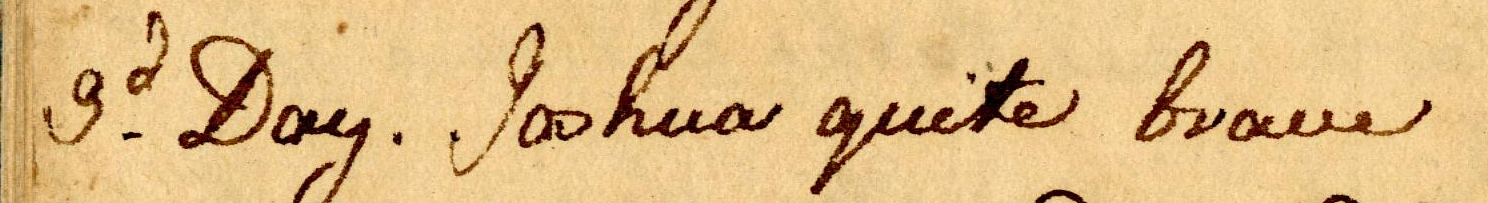3^d. Day. Joshua quite brave
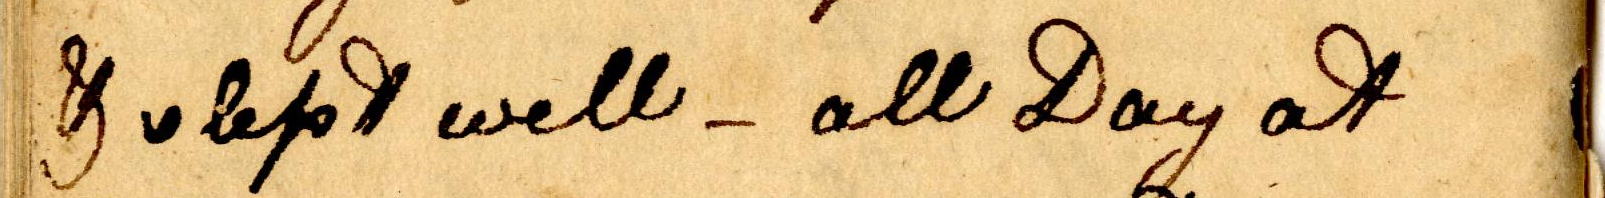& slept well- all Day at
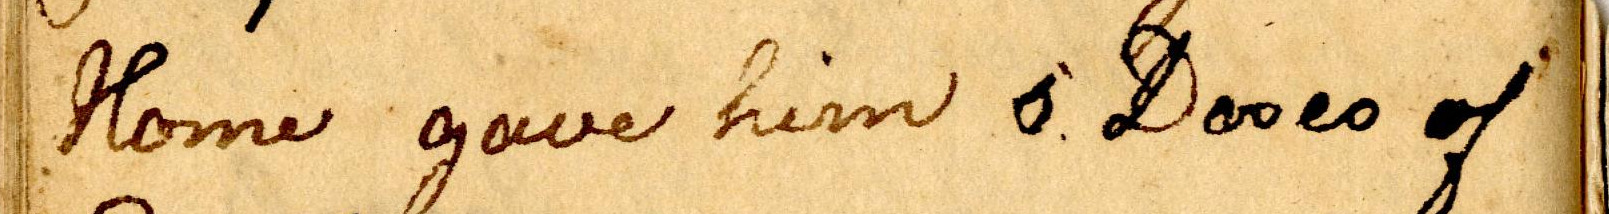Home gave him 5 Doses of
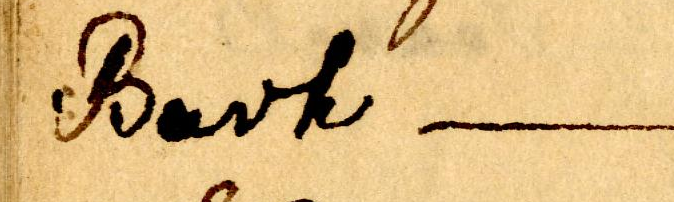Bark-
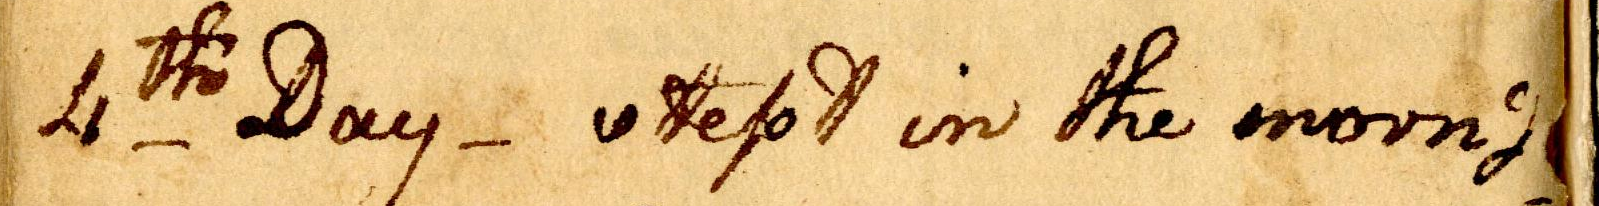4^th Day- stept in the morn^g
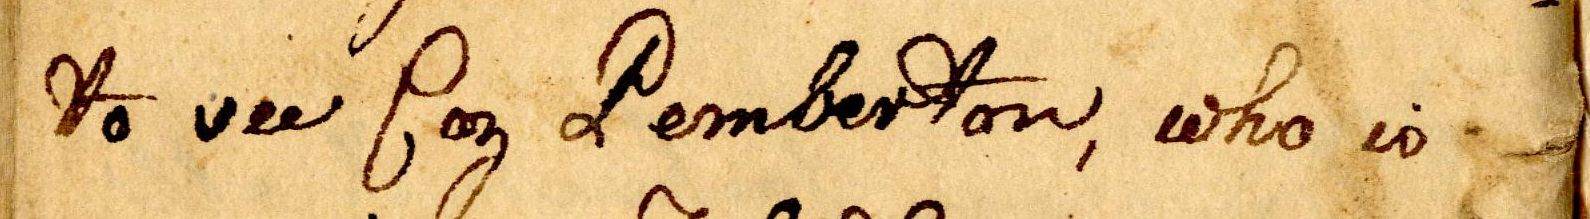to see Coz Pemberton, who is
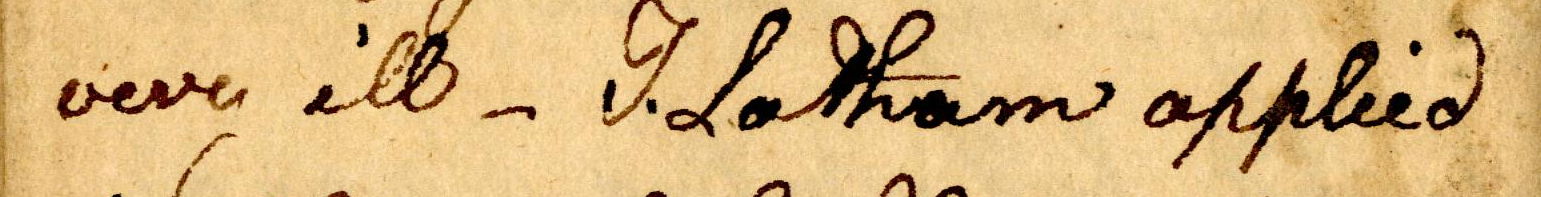very ill- T. Lotham applied
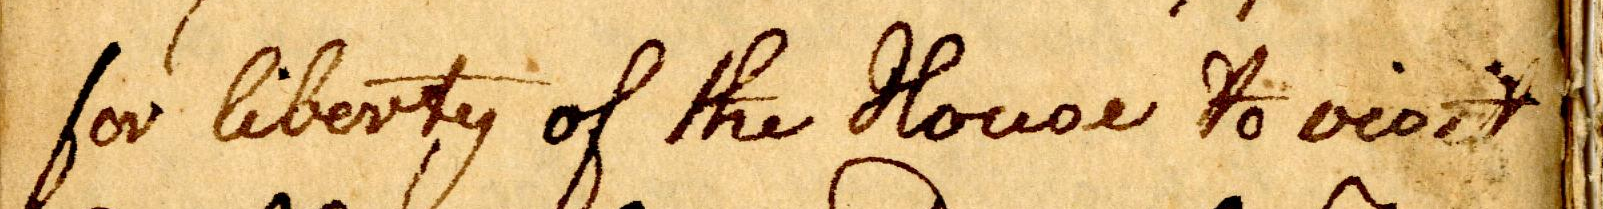for liberty of the House to visit
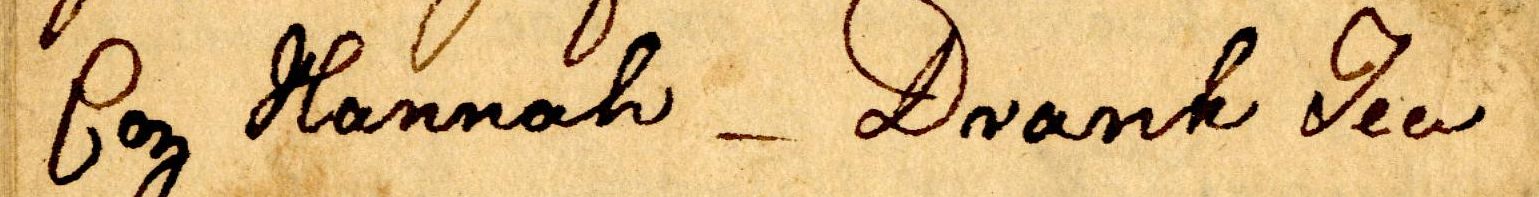Coz Hannah- Drank Tea
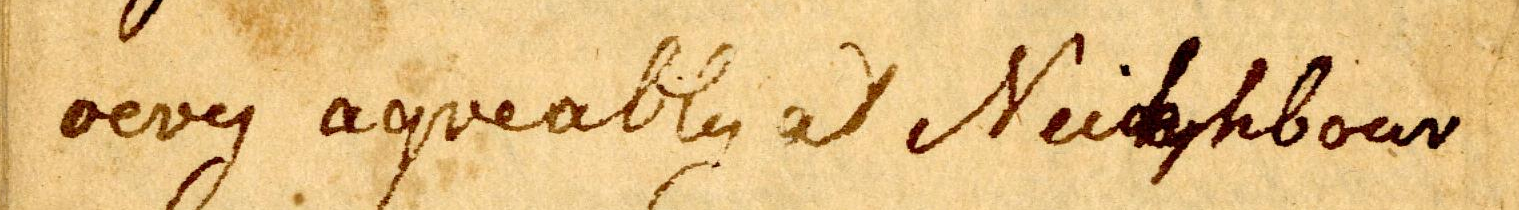very agreably at Neighbour
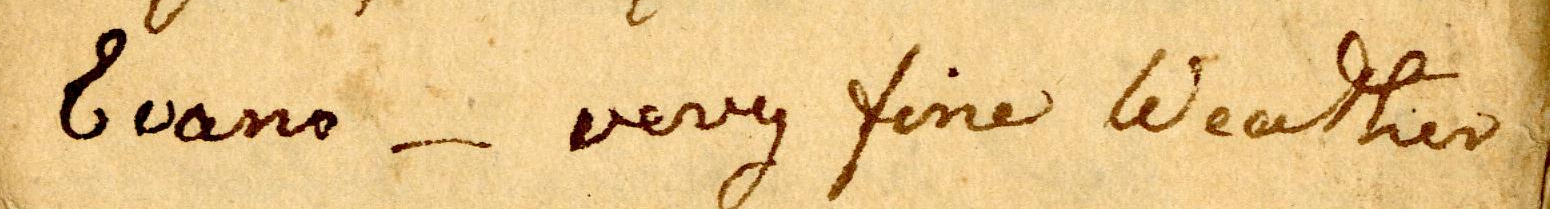Evans- very fine Weather
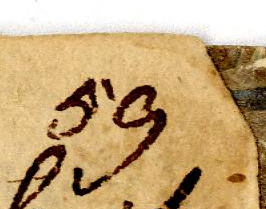59
